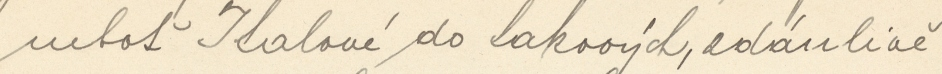neboť Italové do takových, zdánlivě
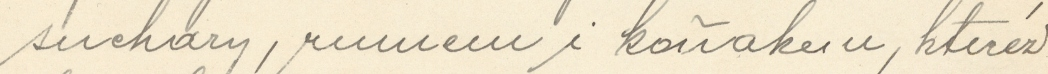suchary, rumem i koňakem, kteréž-
